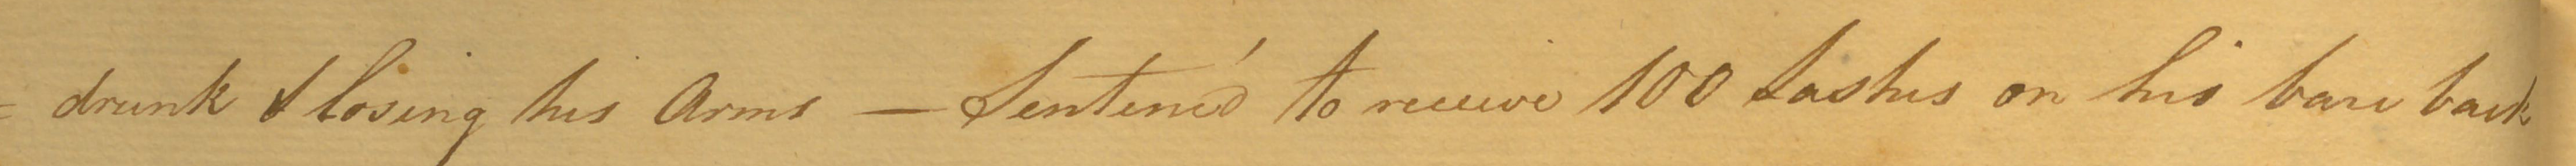drunk & losing his arms- Sentenc'd to receive 100 Lashes on his bare back
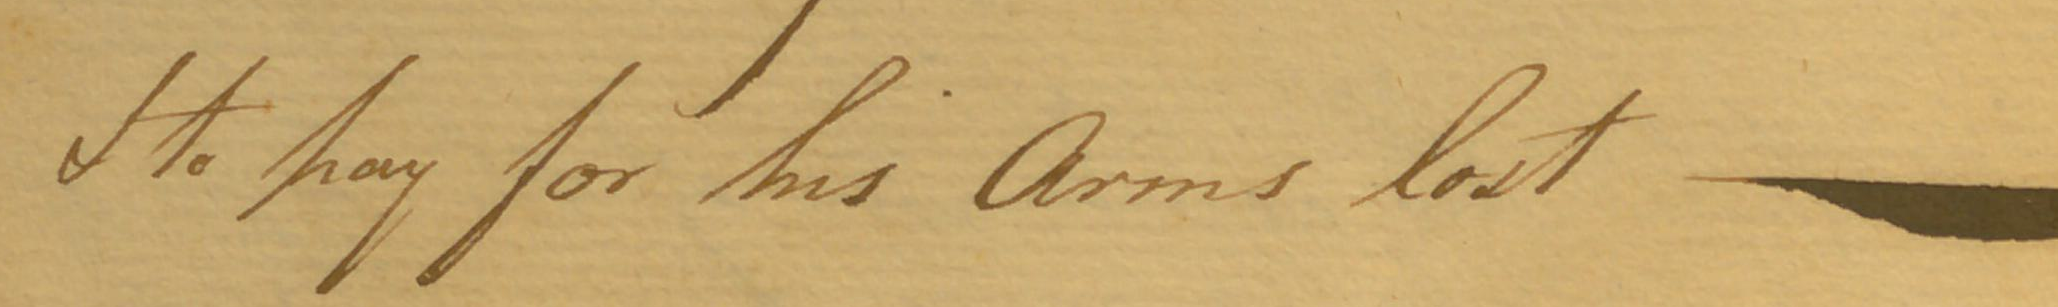& to pay for his Arms lost-
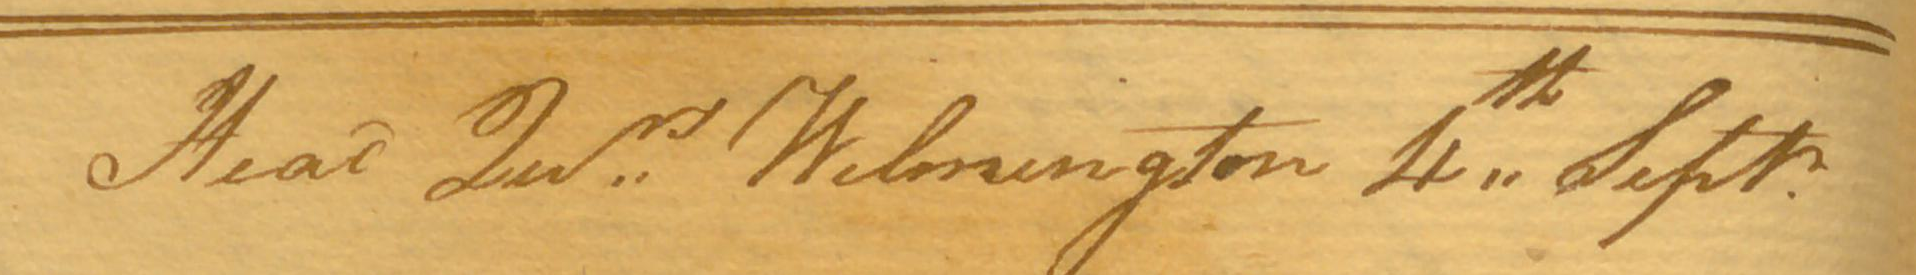Head Qu^rs. Wilmington 4^th. Sept^r.
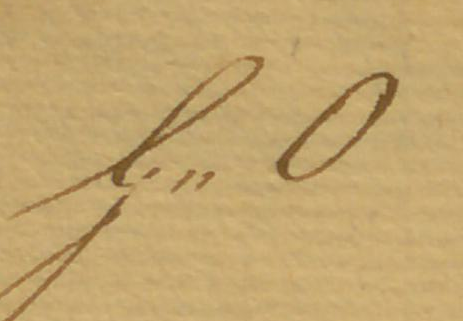G.O
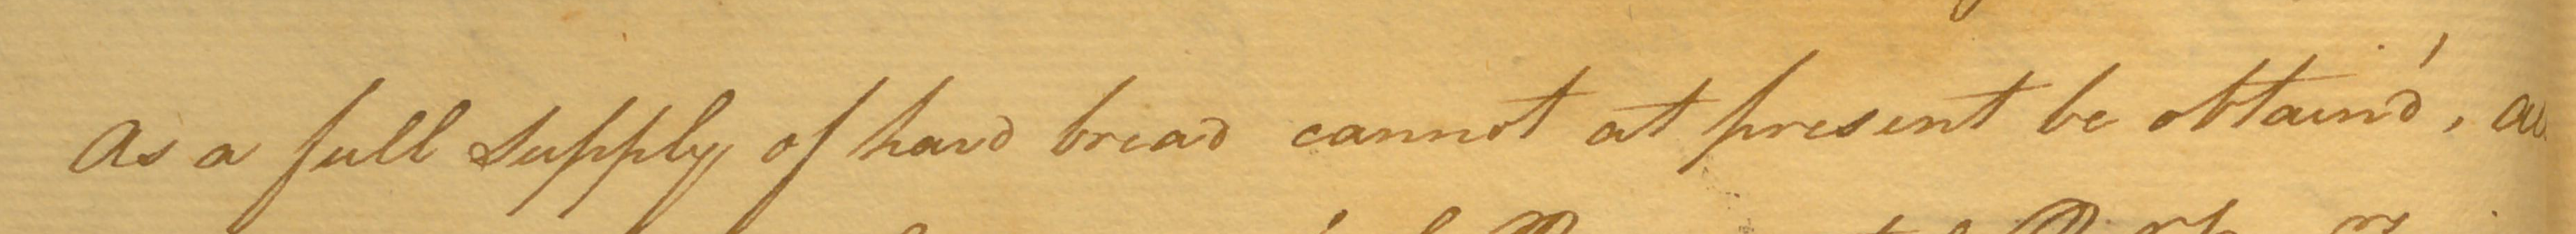As a full supply of hard bread cannot at present be obtain'd, a
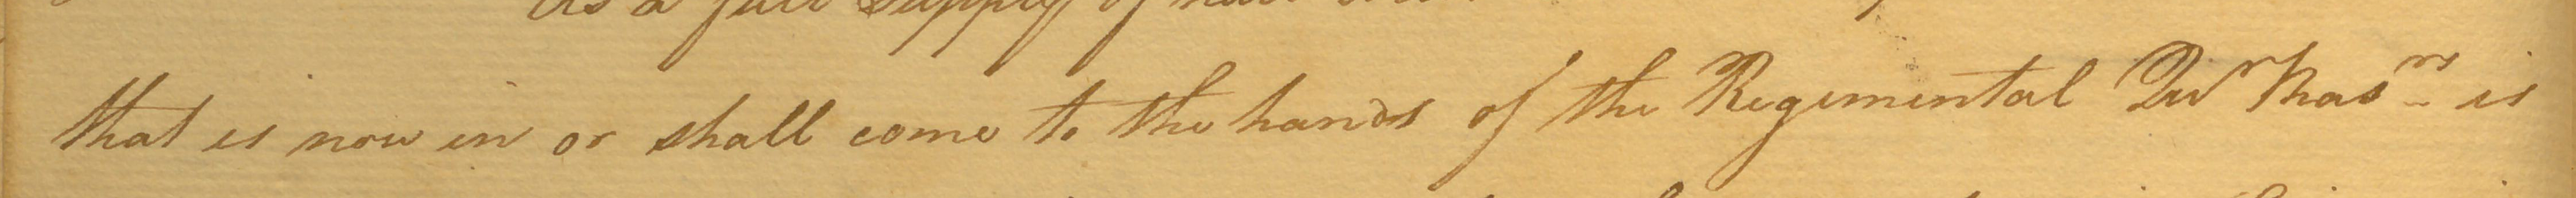that is now in or shall come to the hands of the Regimental Qu^r Mas^rs is
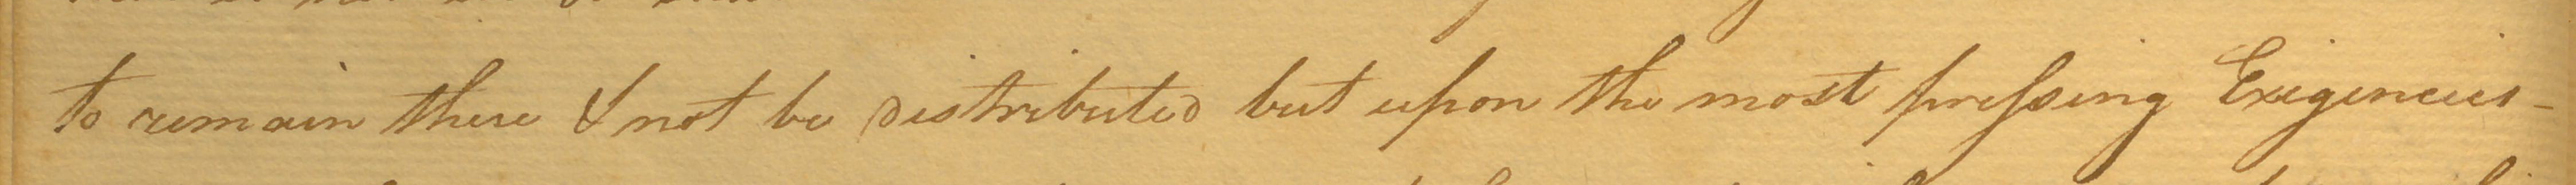to remain there & not be distributed but upon the most pressing Exigencies-
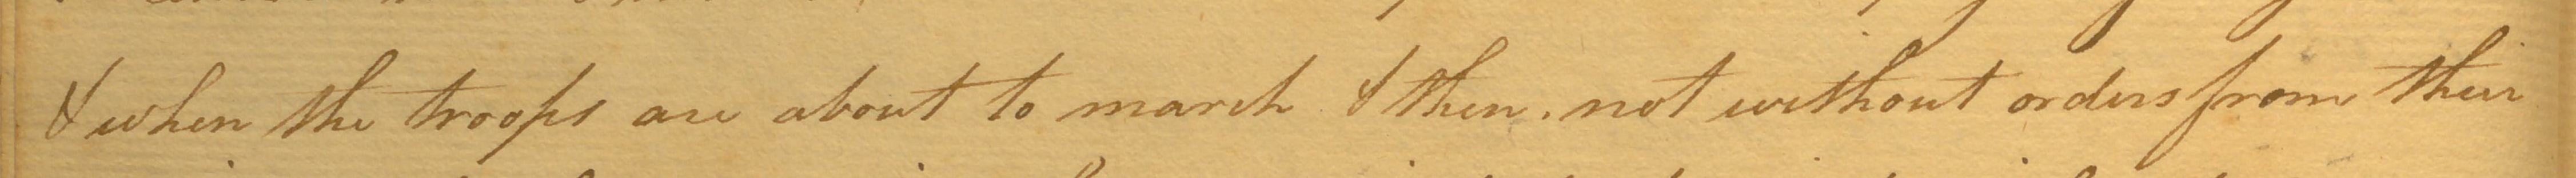& when the troops are about to march & then not without orders from their
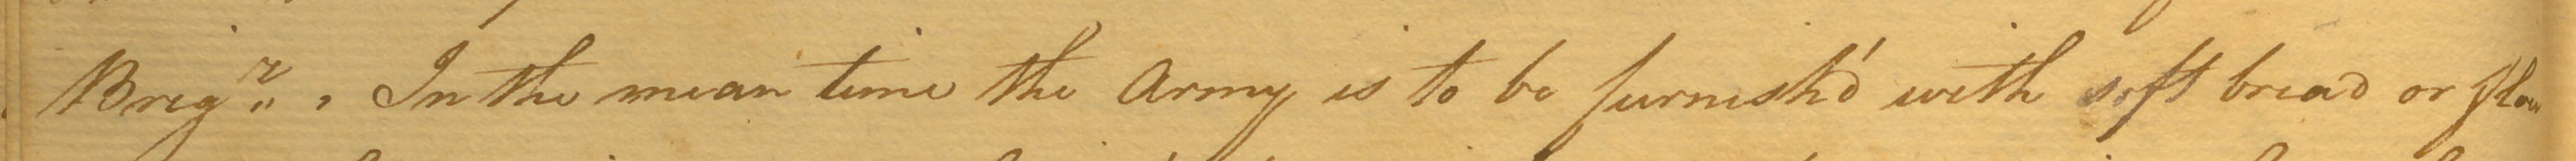Brig^r., In the mean time the Army is to be furnish'd with soft bread or flour
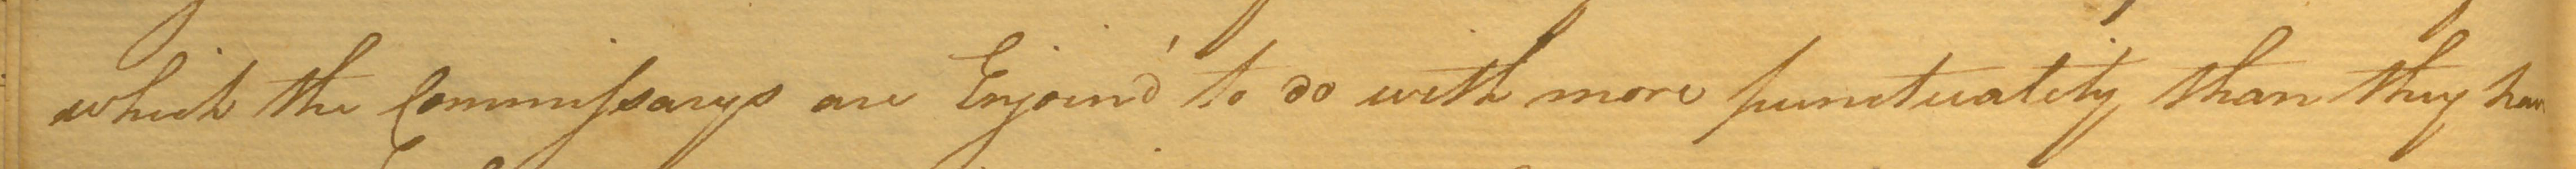which the Commissarys are Enjoin'd to do with more punctuality than they have
